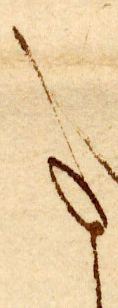To
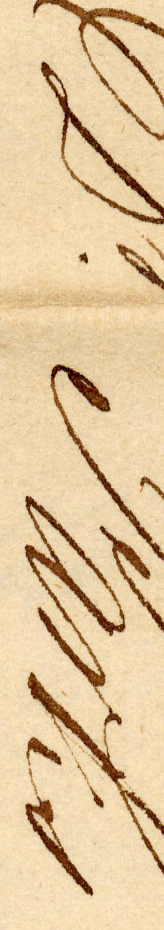D^r. Parks
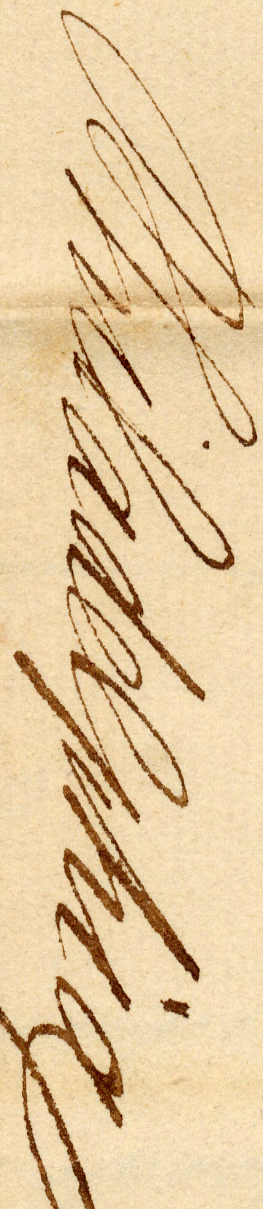Philadelphia
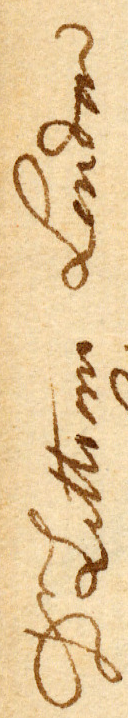D^r Lettsom London
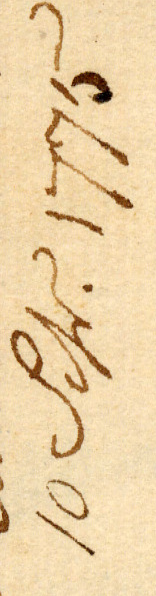10 Sep^r. 1775
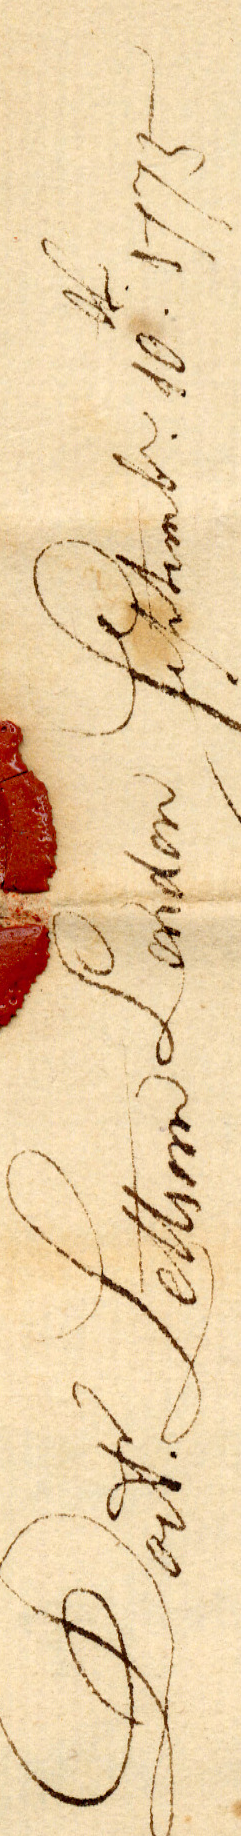Doct^r. Lettsom London Septemb^r. 10^th. 1775
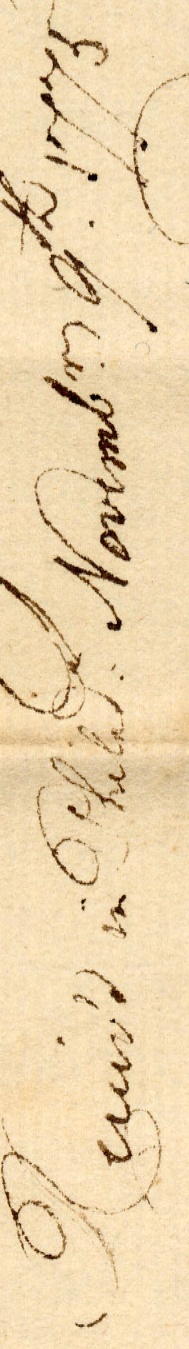Receiv'd in Philad: Novemb^r. 9^th. 1775
